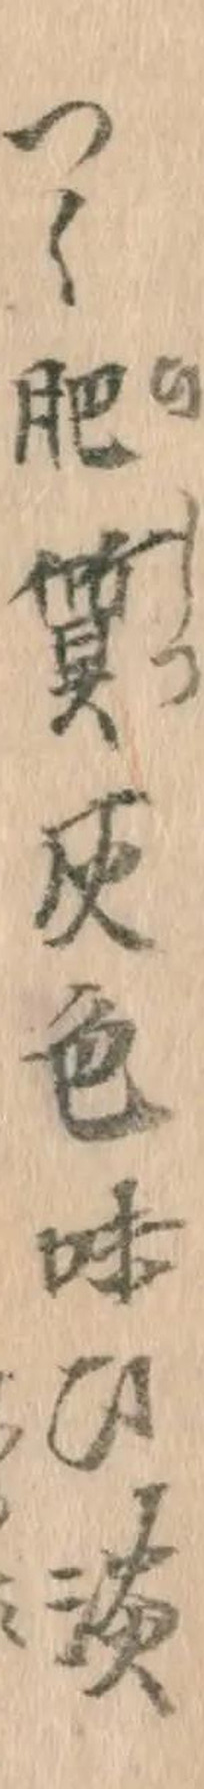つく肥質灰色味ひ淡
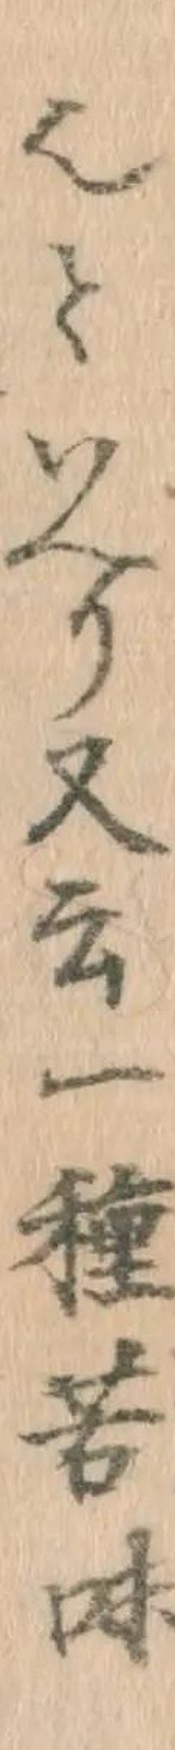也といへり又云一種苦味
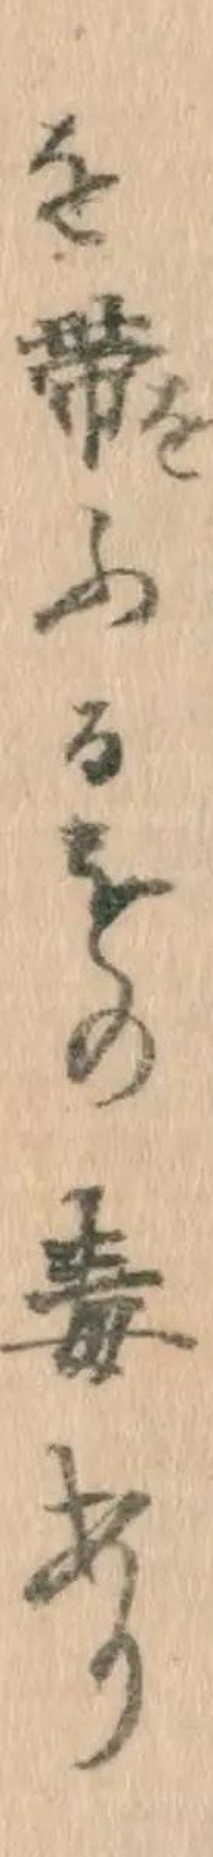を帯ふるもの毒あり
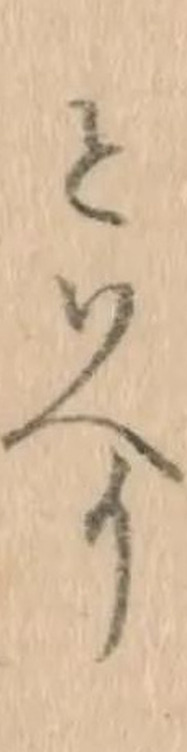といへり
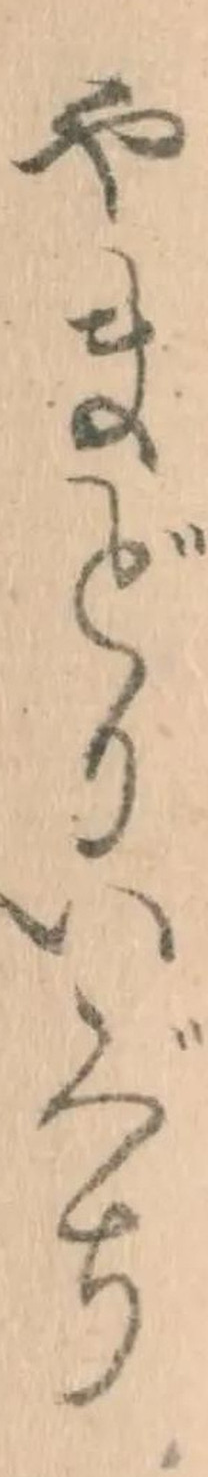やまどりいぐち
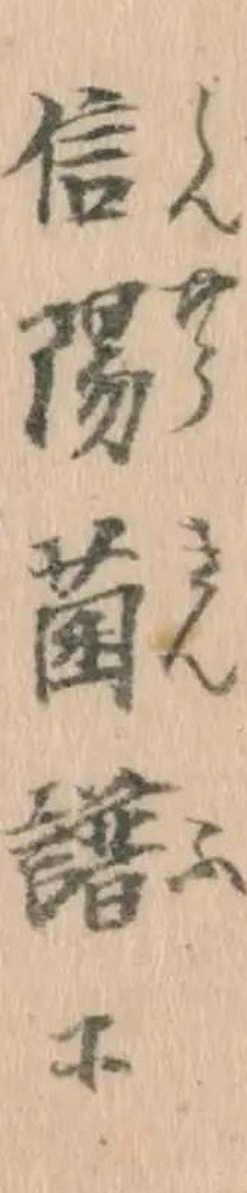信陽菌譜に
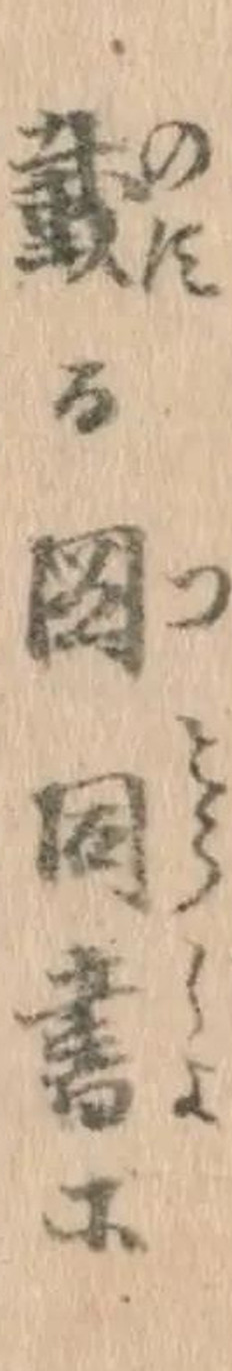載る図同書に
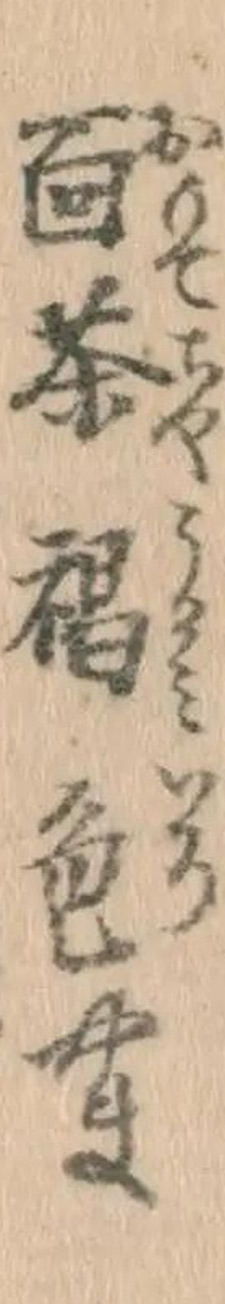面茶褐色やま
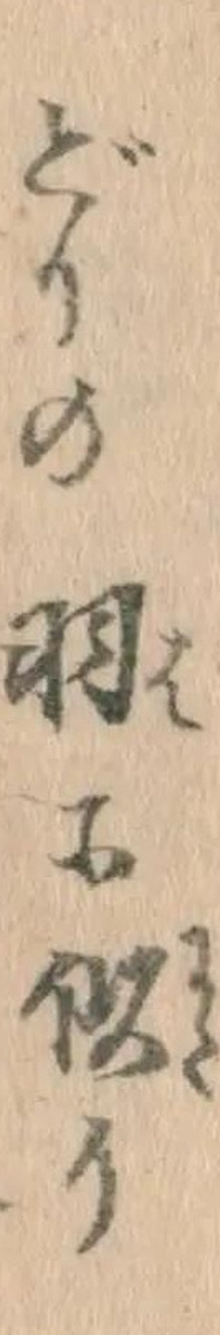どりの羽に似り
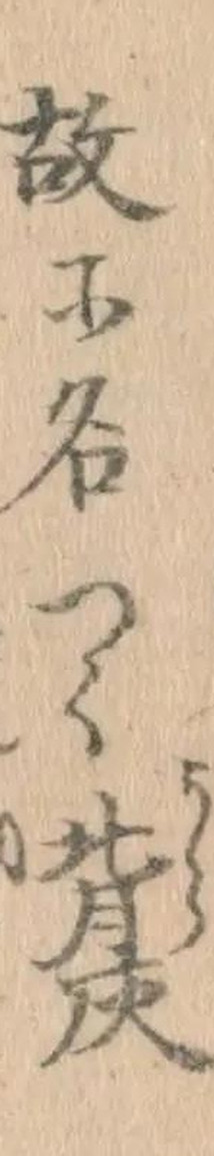故に名つく背灰
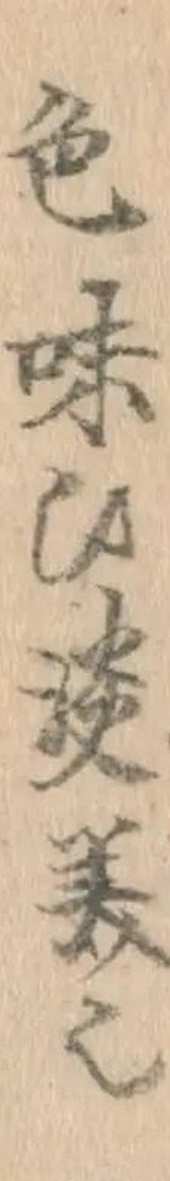色味ひ淡美也
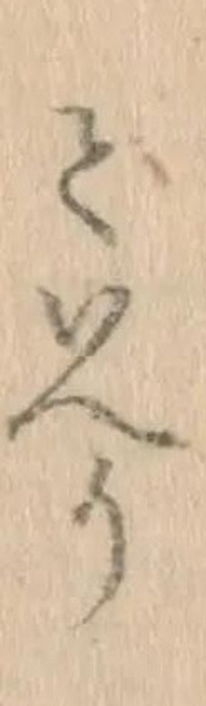といへり

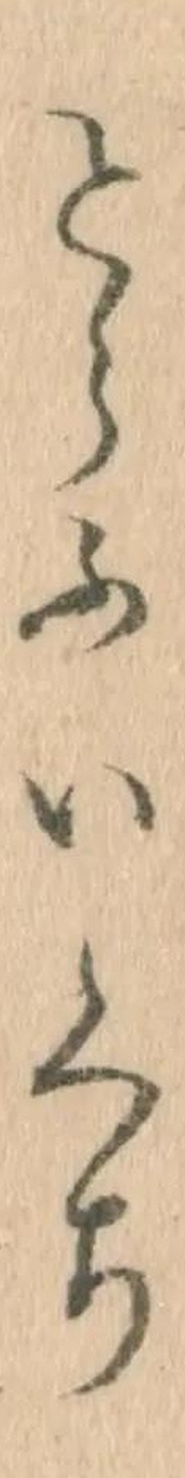とらふいくち
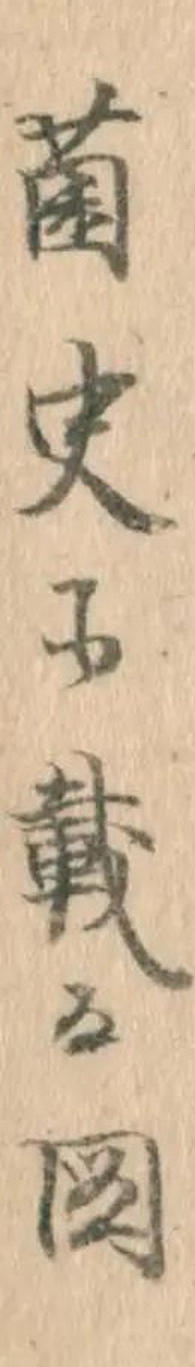菌史に載る図
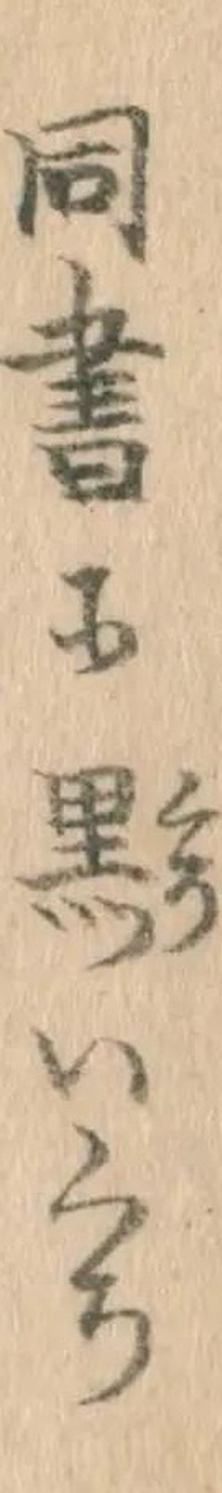同書に黒いくち
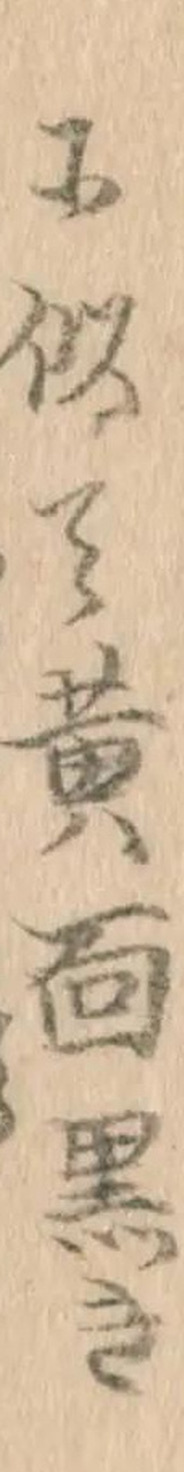に似て黄面黒き
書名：本草図譜. 巻58-60
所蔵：国立国会図書館 National Diet Library, JAPAN
